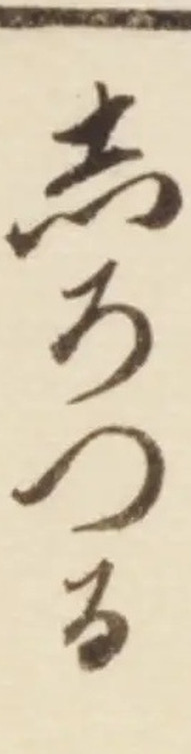しろつる

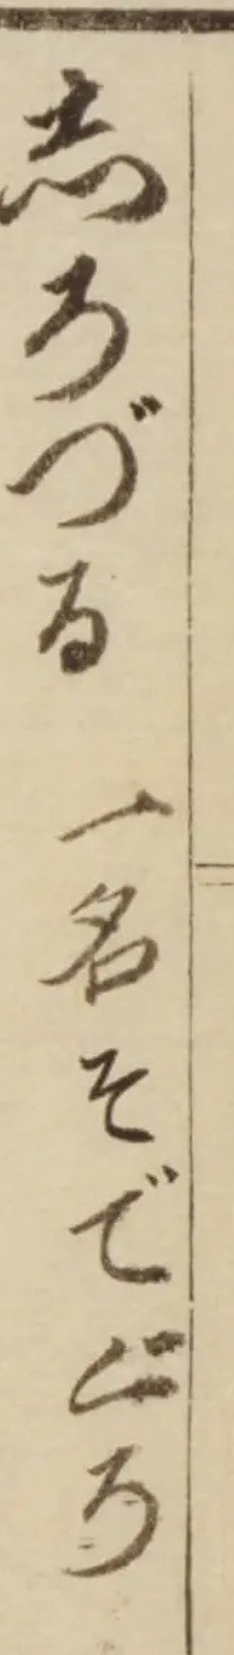しろづる一名そでぐろ
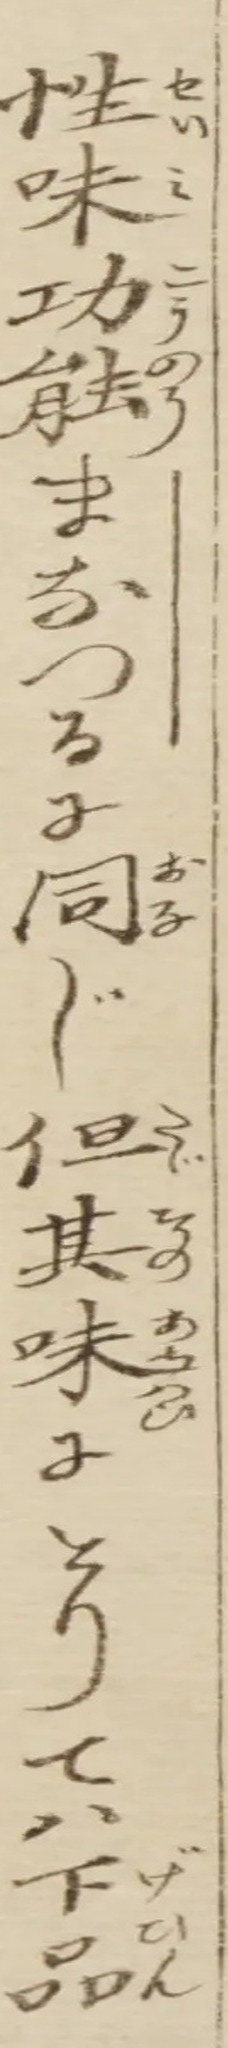性味功能まなつるに同じ但其味にとりては下品

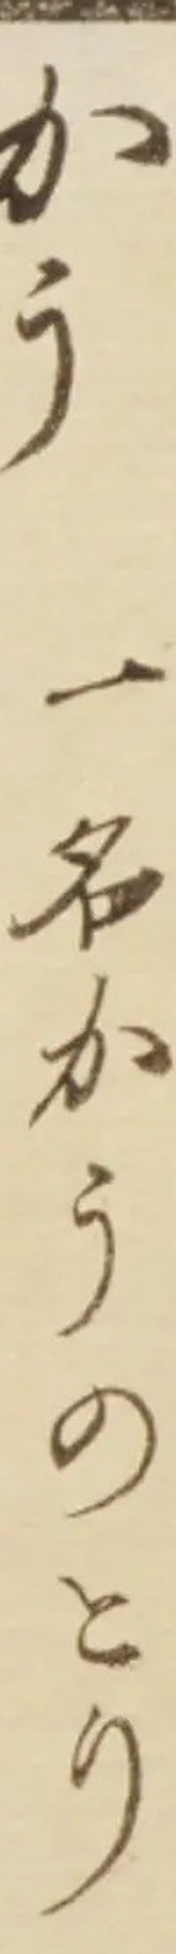かう一名かうのとり
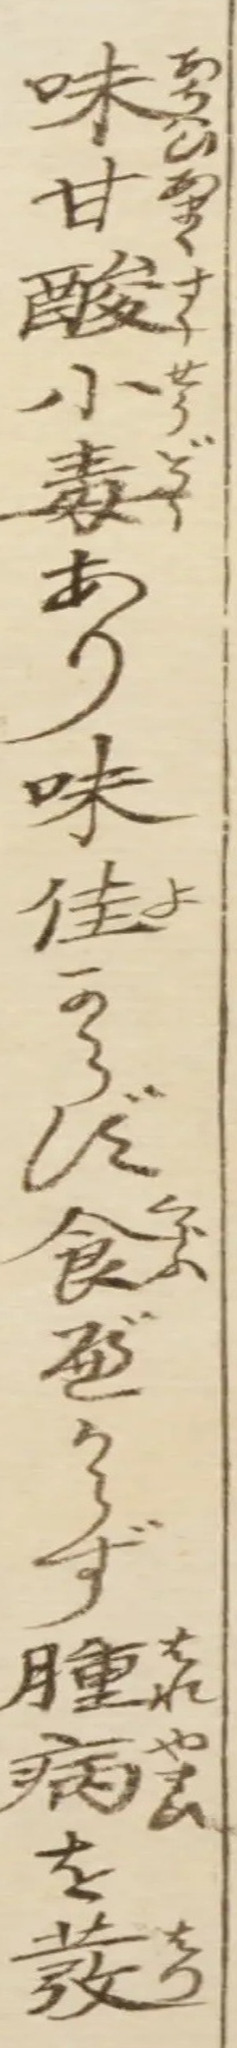味甘酸小毒あり味佳からず食べからず腫病を発

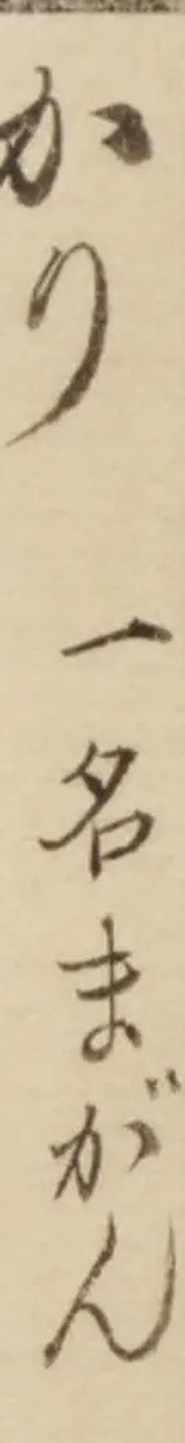かり一名まがん
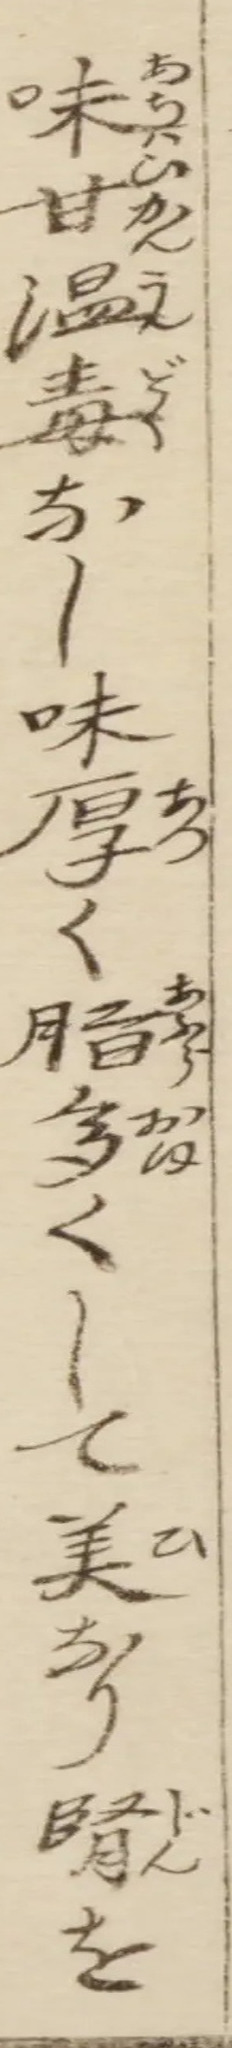味甘温毒なし味厚く脂多くして美なり腎を
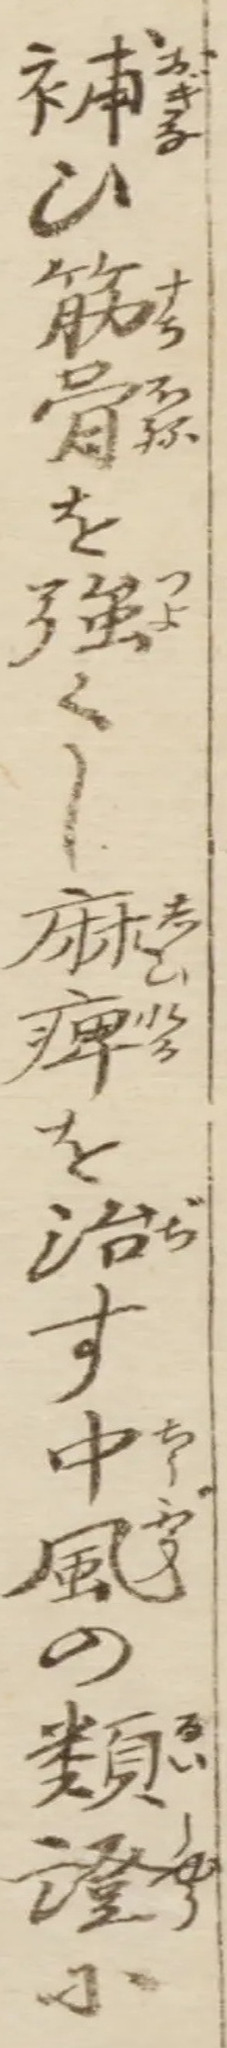補ひ筋骨を強くし麻痺を治す中風の類証に
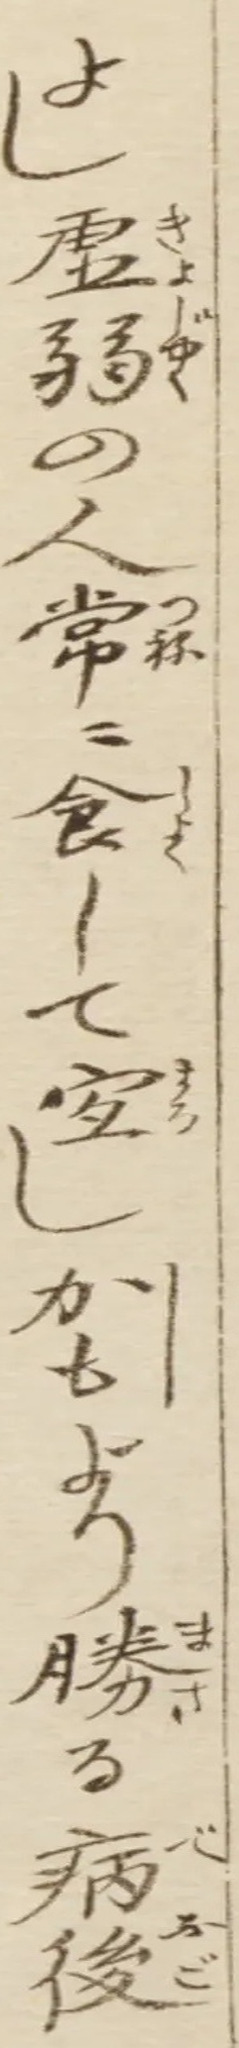よし虚弱の人常に食して宜しかもより勝る病後
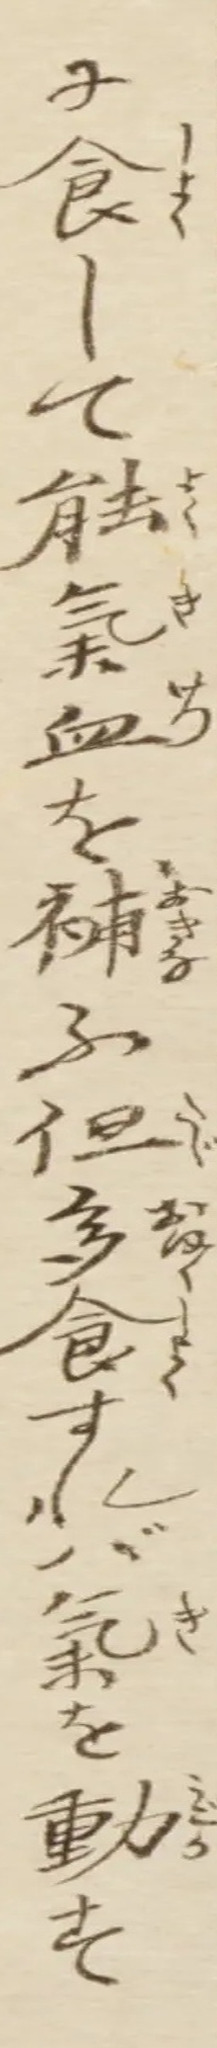に食して能気血を補ふ但多食すれば気を動す
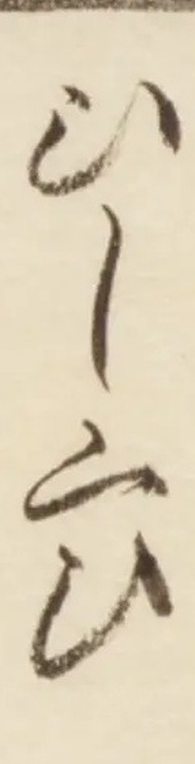ひしくひ

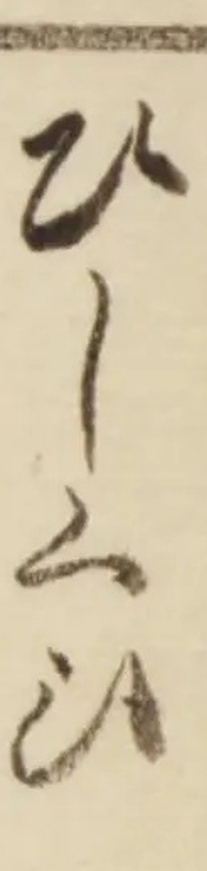ひしくひ
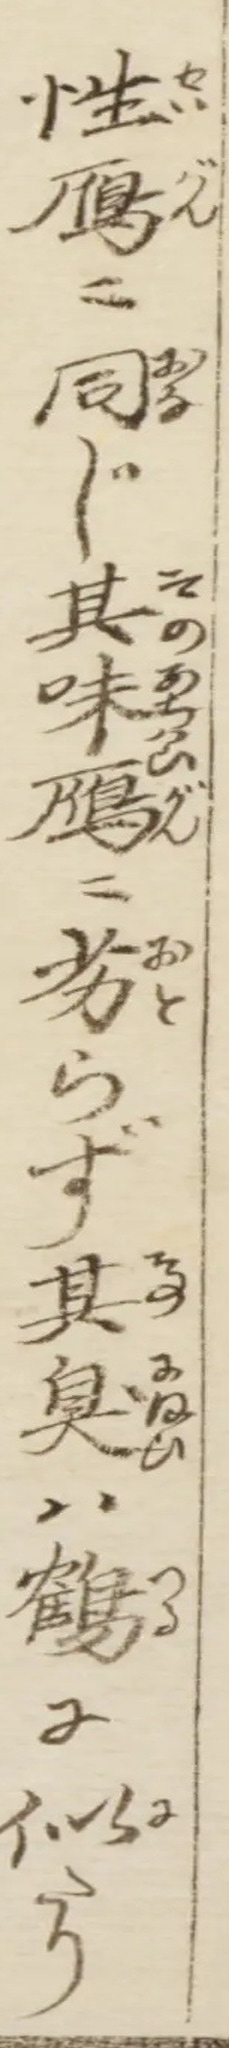性鴈に同じ其味鴈に劣らず其臭は鶴に似たり
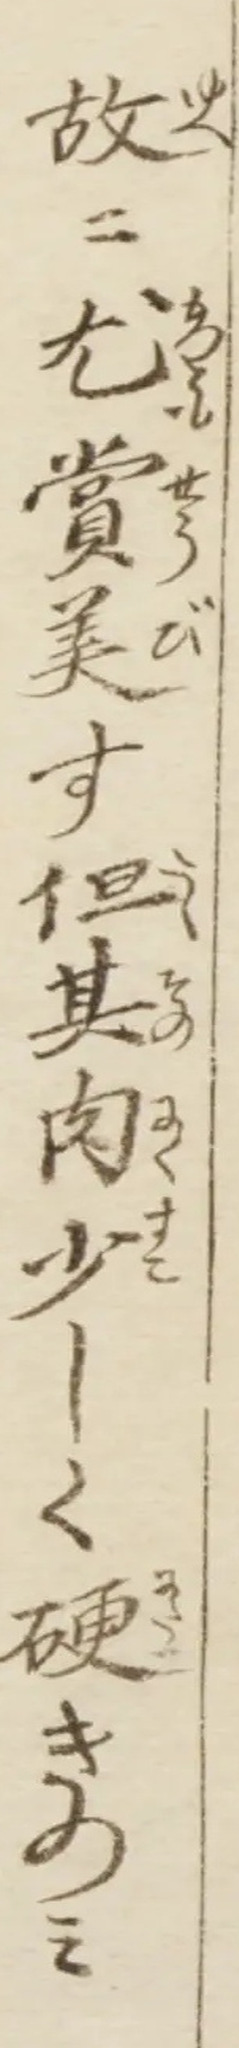故に尤賞美す但其肉少しく硬きのみ
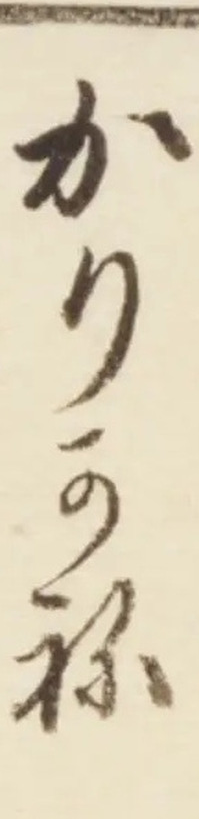かりかね

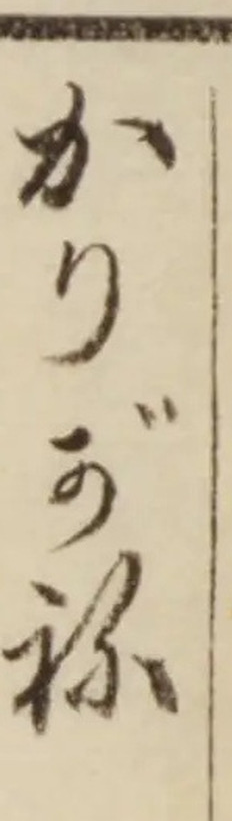かりがね
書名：華鳥譜
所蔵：国立国会図書館 National Diet Library, JAPAN
